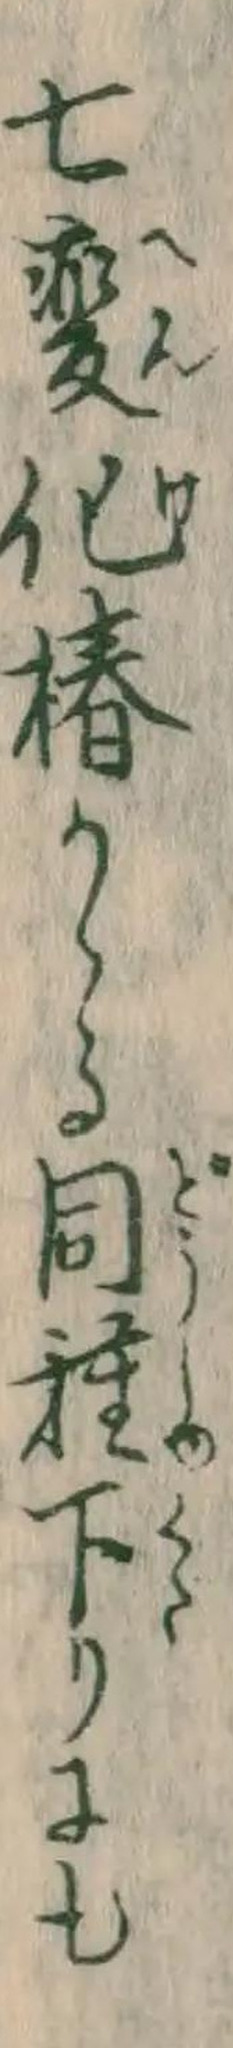七変化椿かゝる同種下りにも
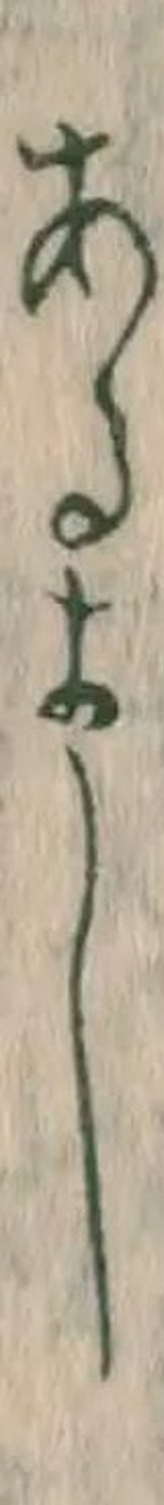あるよし
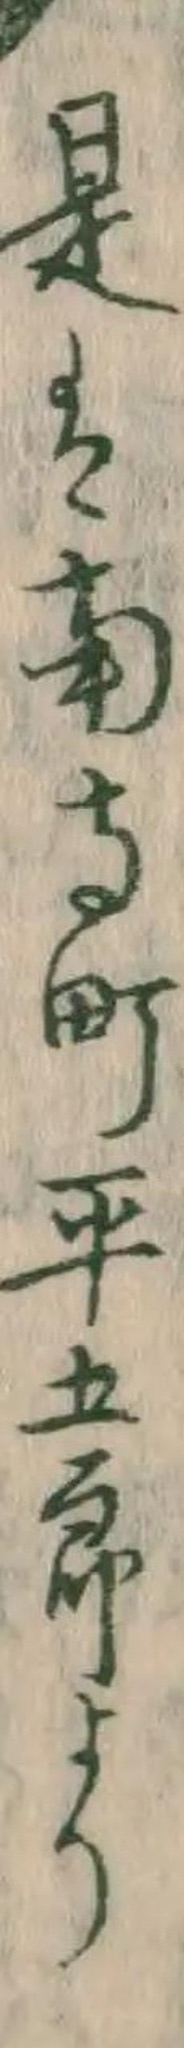是は南寺町平五郎より
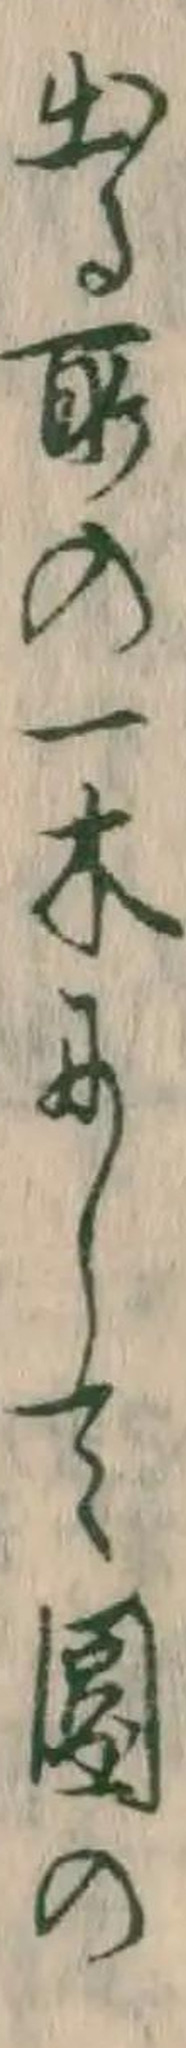出る所の一木にして図の
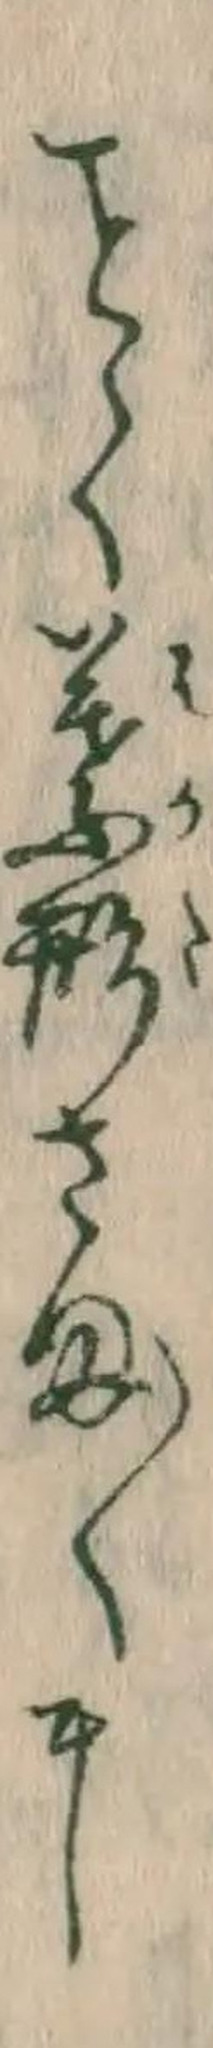ことく葉形さま〳〵に
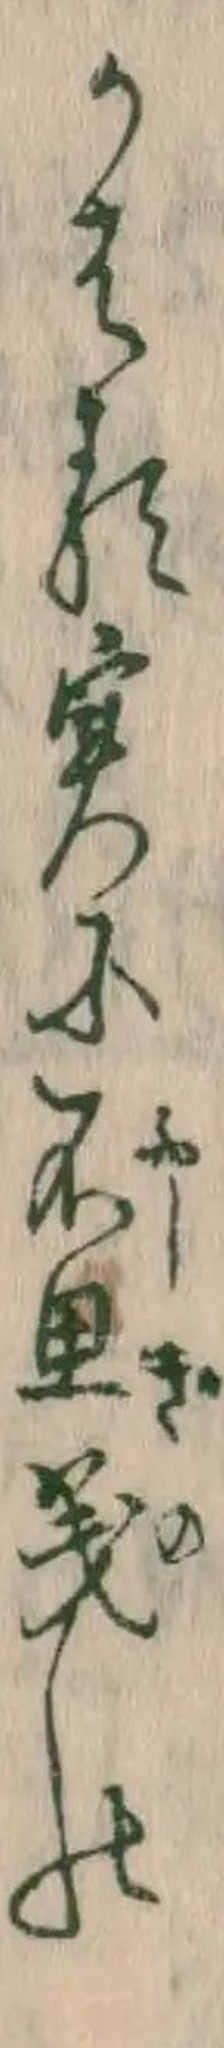かはる実に不思義の
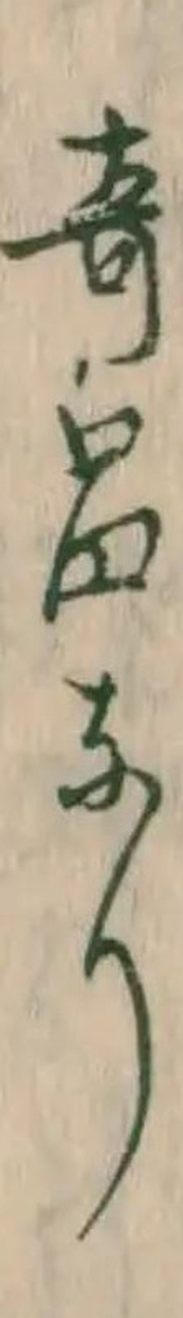奇品なり
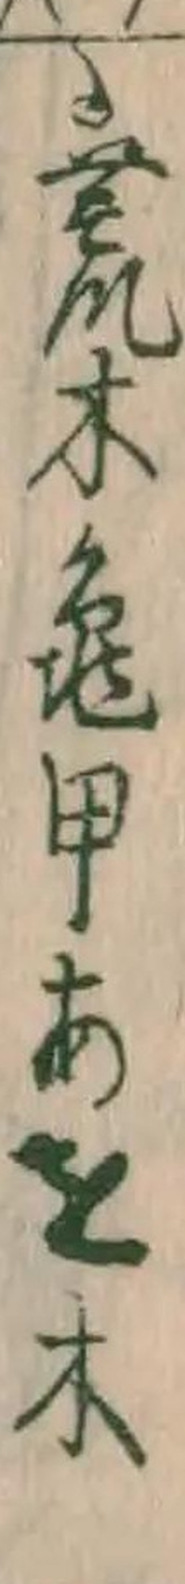荒木亀甲あを木
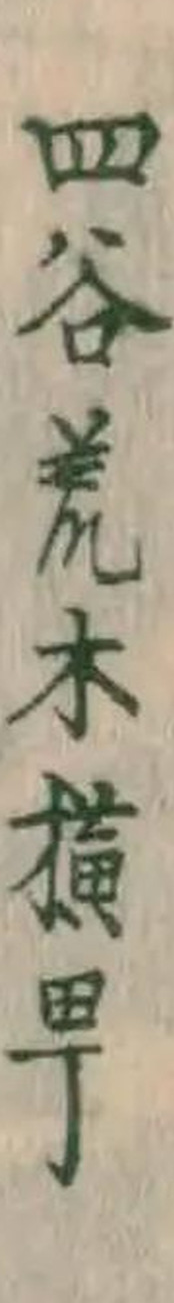四谷荒木横町
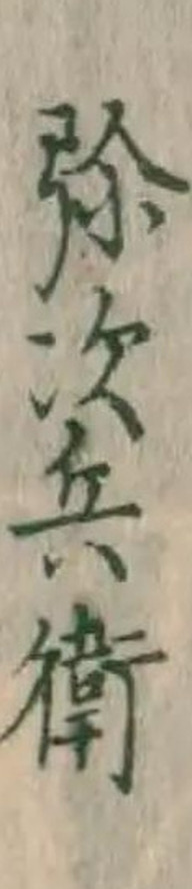弥次兵衛
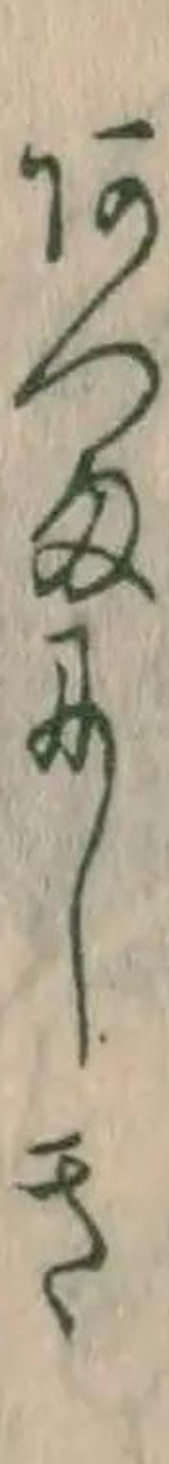あつまにしき
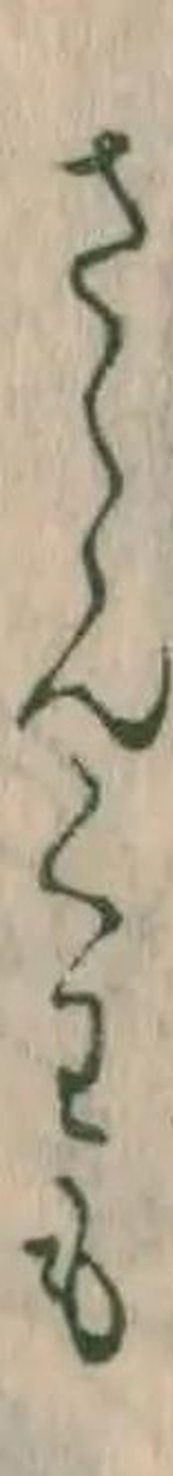さゝんくわも
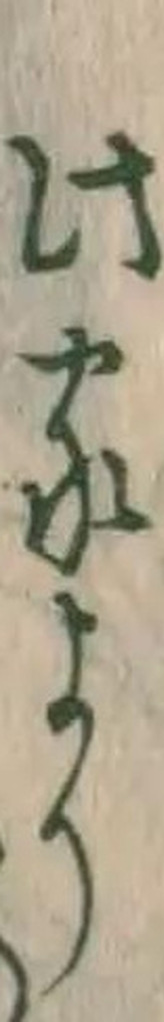此家より
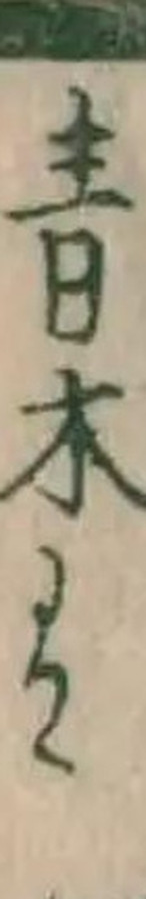青木は
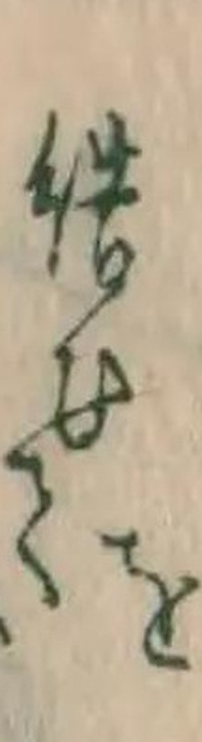結ひては
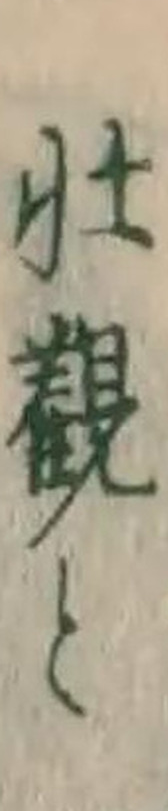壮観と
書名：草木奇品家雅見 3巻. [3]
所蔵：国立国会図書館 National Diet Library, JAPAN
